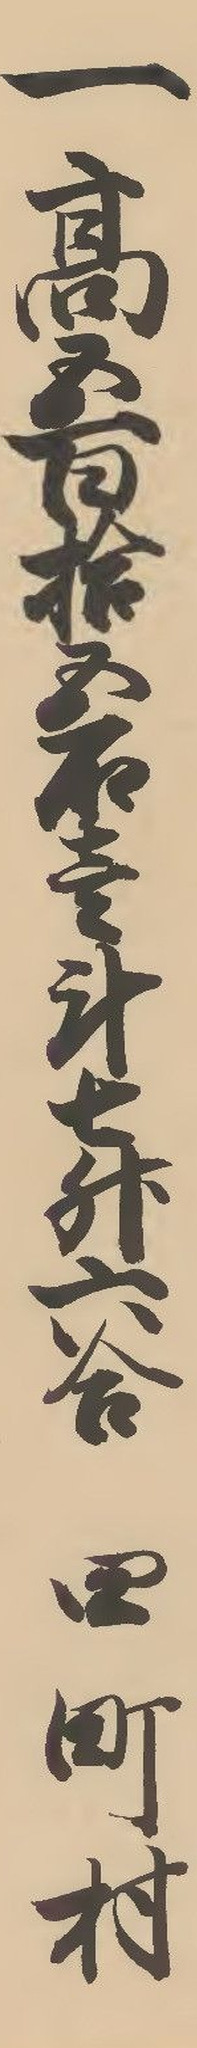一髙五百拾五石壱斗七升六合四町村

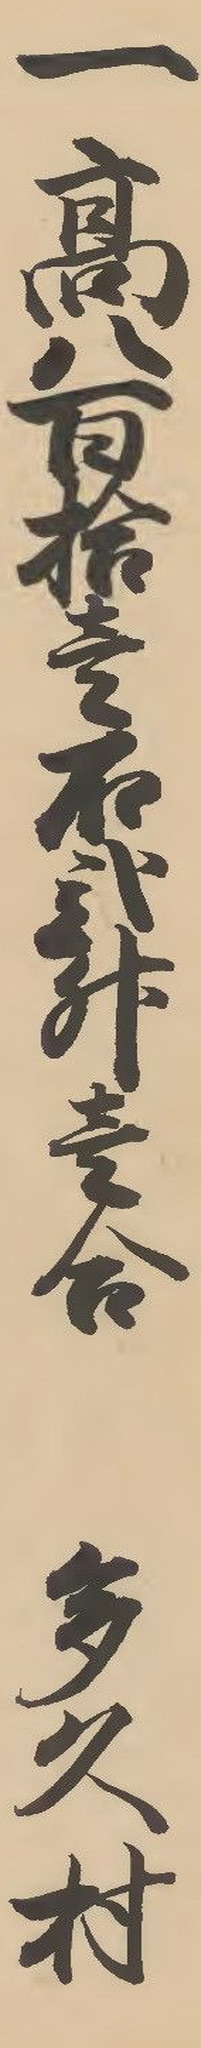一髙八百拾壱石弐升壱合多久村
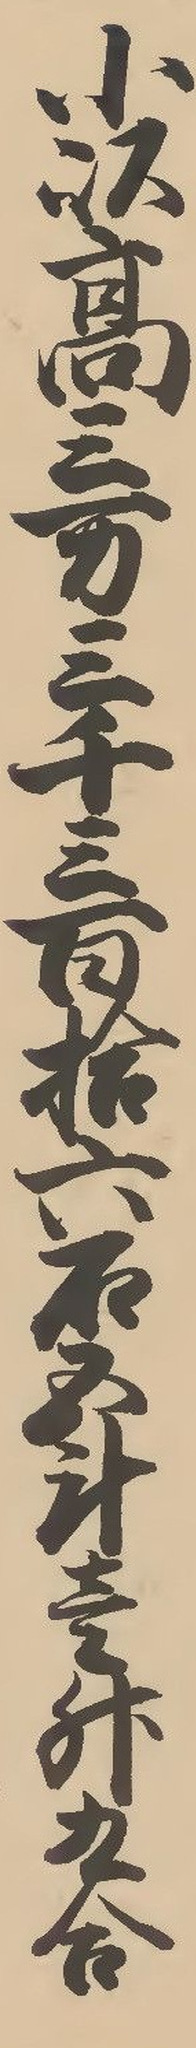小以髙三万三千三百拾六石五斗壱升九合
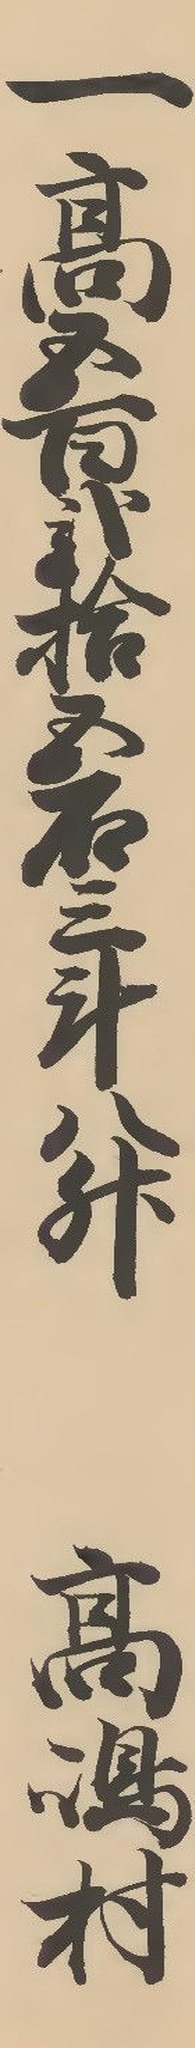一髙五百弐拾五石三斗八升高嶋村
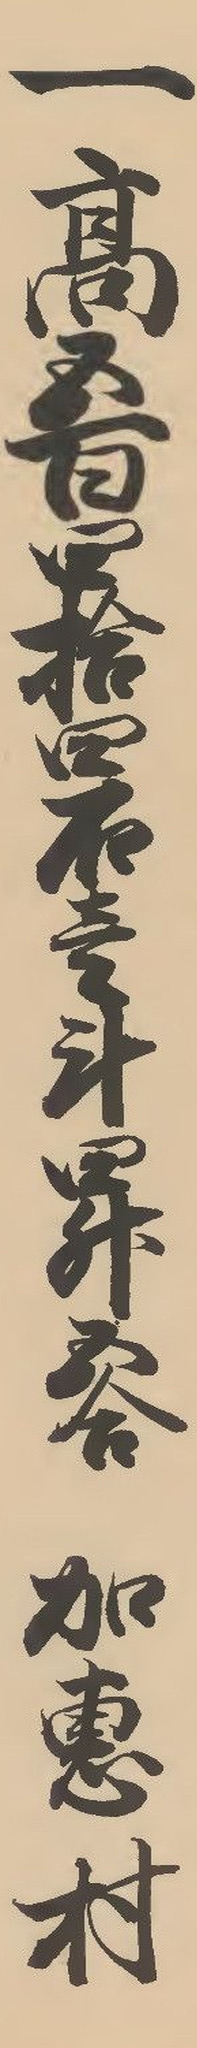一髙五百四拾四石壱斗四升五合加恵村
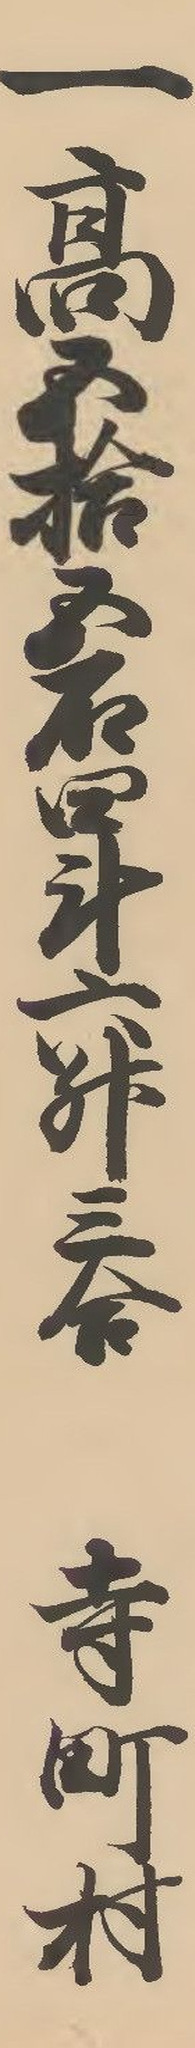一髙五拾五石四斗六升三合寺町村

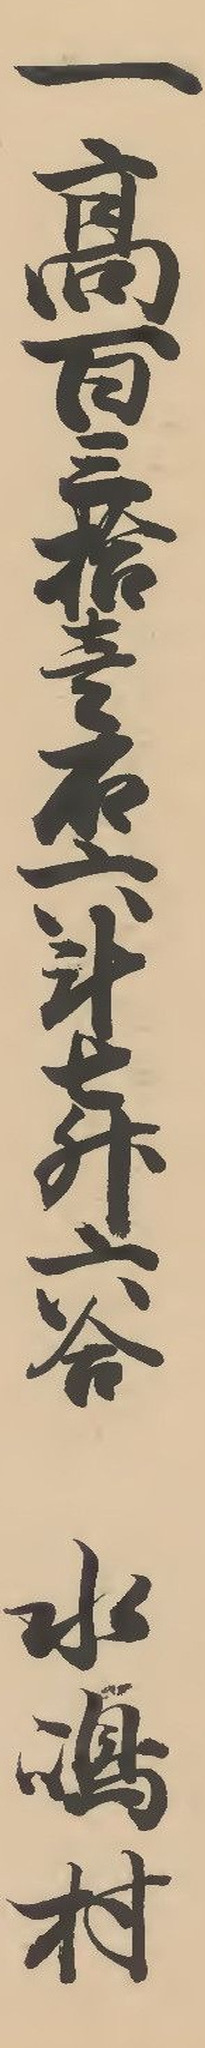一髙百三拾壱石六斗七升六合水嶋村
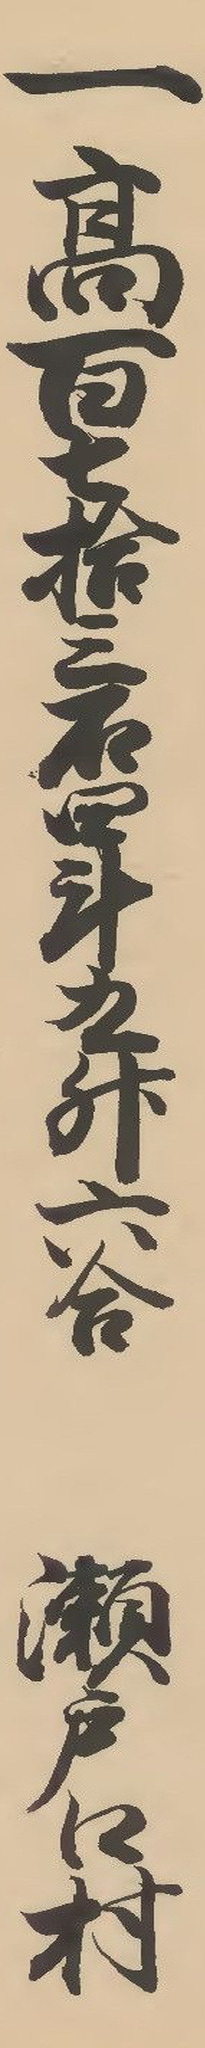一髙百七拾三石四斗九升六合瀬戸口村
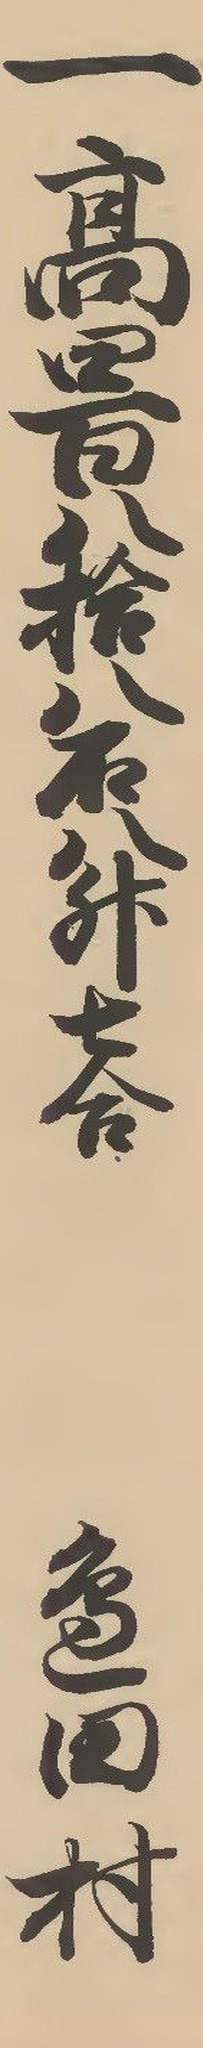一髙四百八拾八石八升七合邊田村
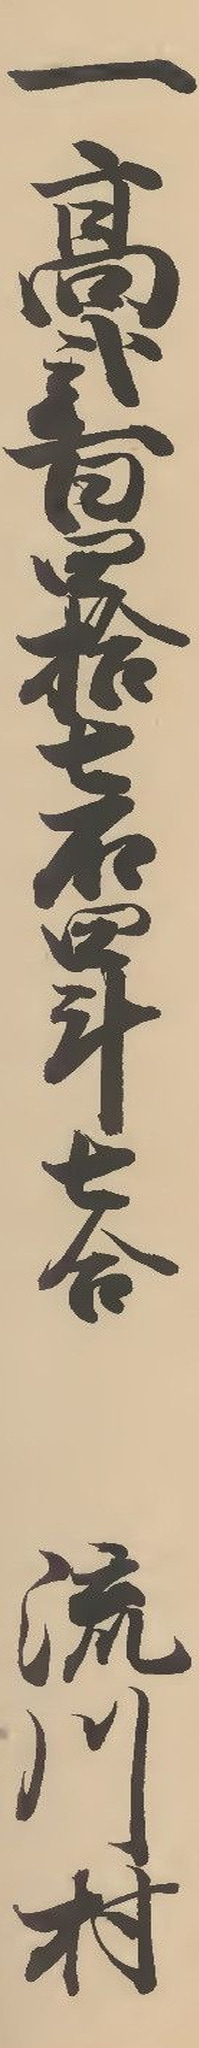一髙弐百四拾七石四斗七合流川村
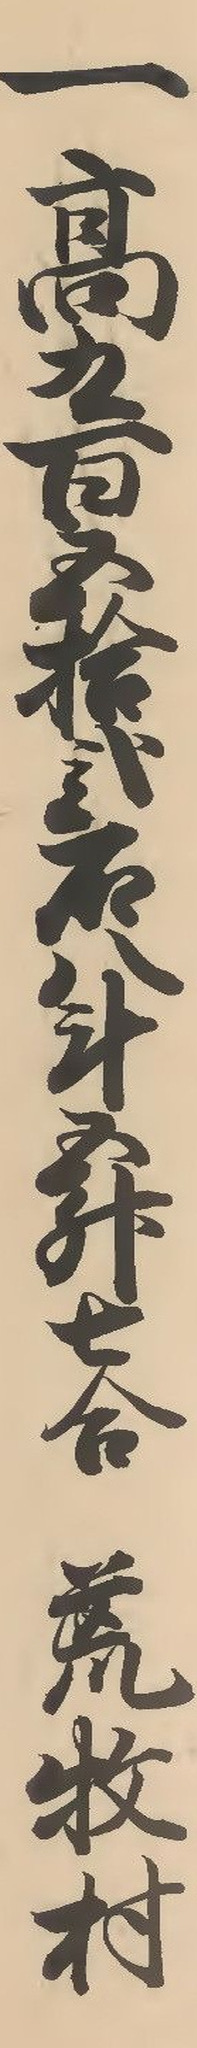一髙九百五拾弐石八斗五升七合荒牧村
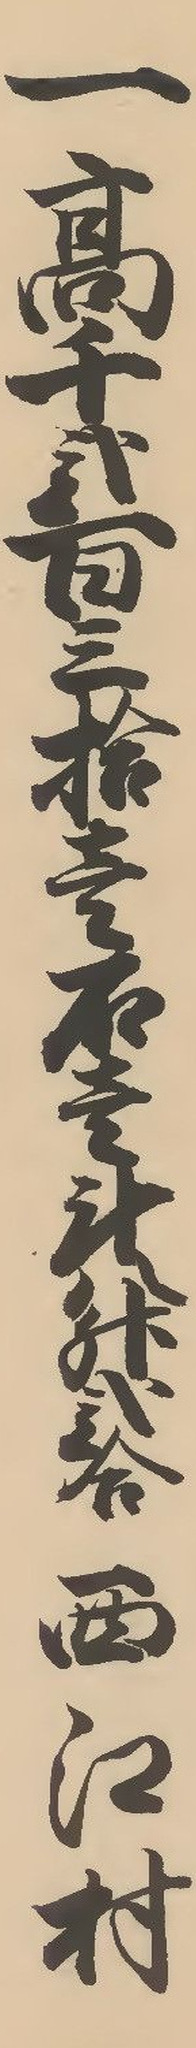一髙千弐百三拾壱石壱斗八升弐合西江村
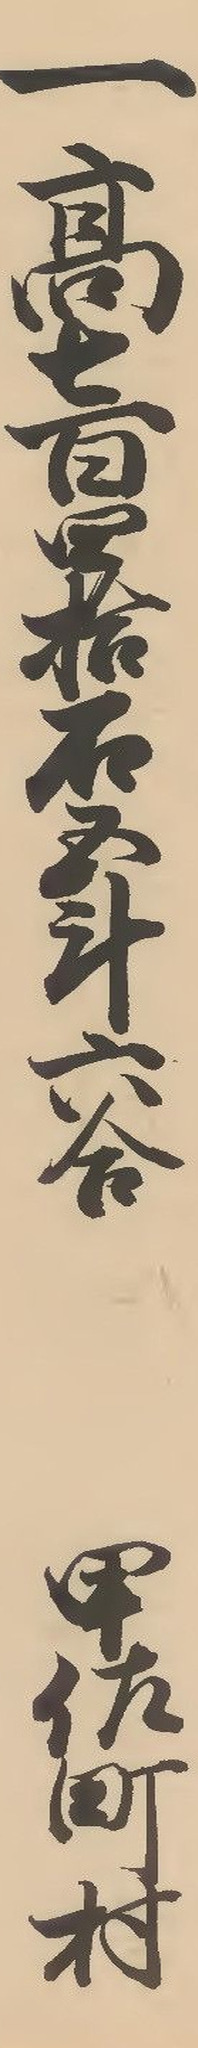一髙七百四拾石五斗六合甲佐町村
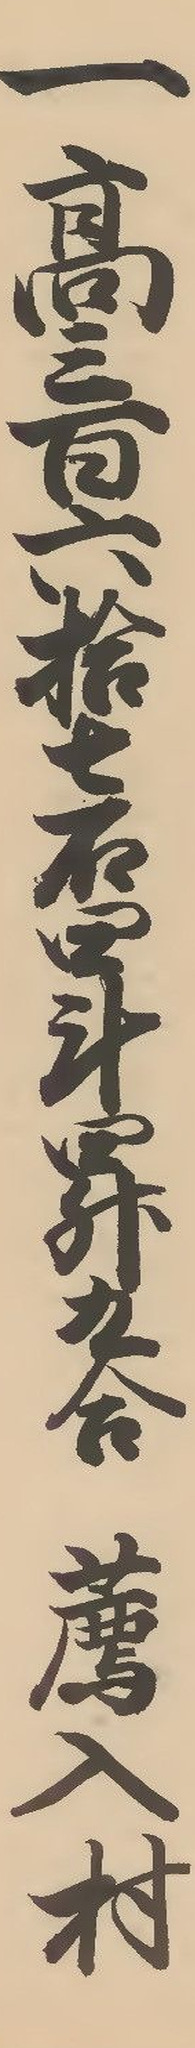一髙三百六拾七石四斗四升九合薦入村

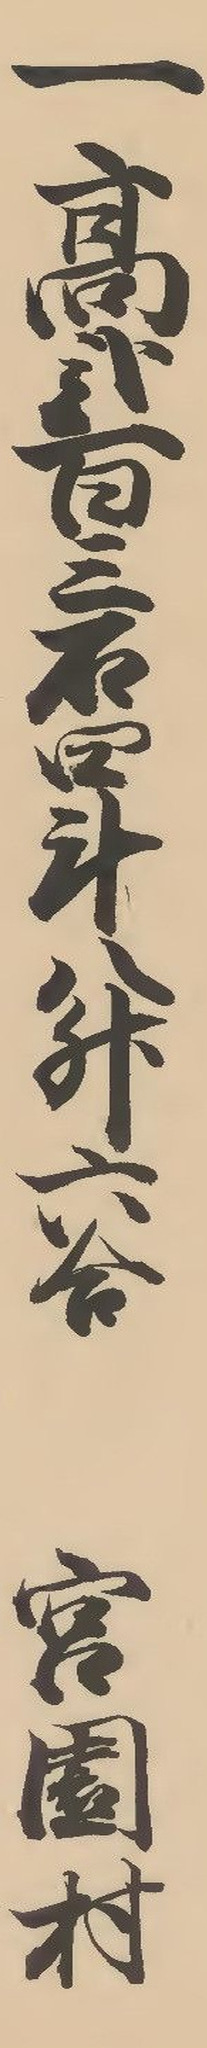一髙弐百三石四斗八升六合宮薗村
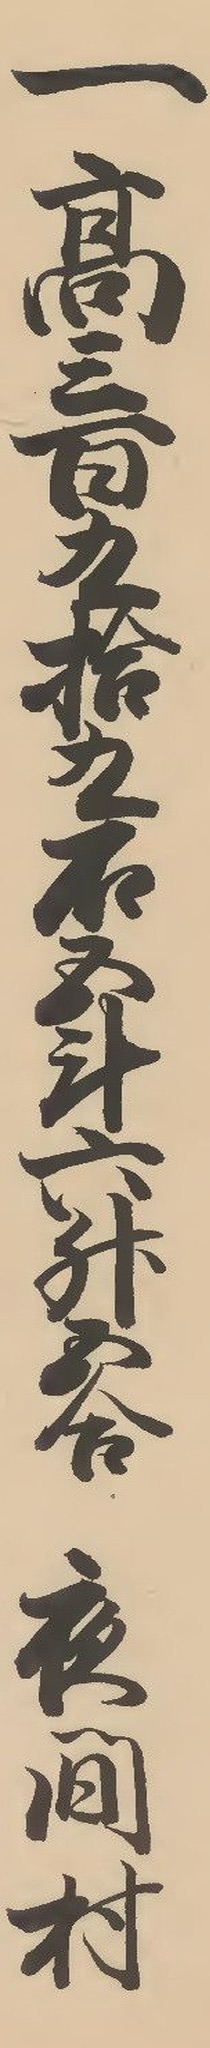一髙三百九拾九石五斗六升五合夜間村
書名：肥後国郷帳
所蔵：国立公文書館 National Archives of Japan
